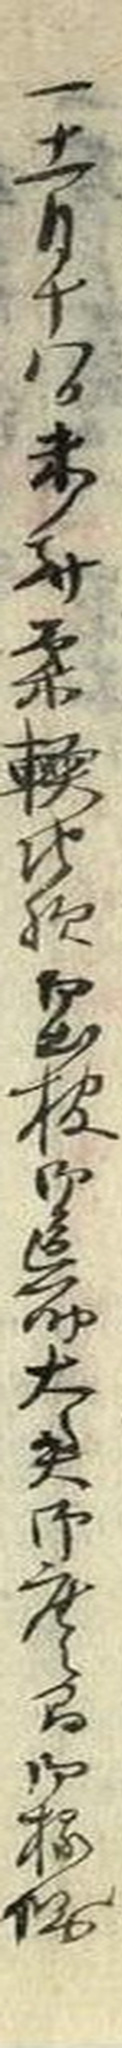一十一月十八日未ノ刻柔輭院様御出棺御道筋大奥御座之間御縁側
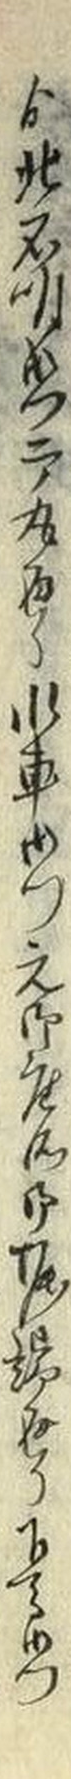ゟ北不明御門二ノ丸通り水車御門元御座所御堀端通り下馬御門
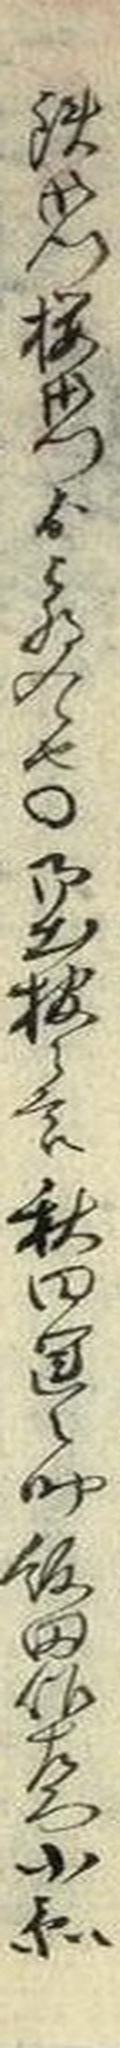鉄御門桜御門ゟ被為入候由〇御出棺之節秋田運之助飯田作左衛門小兵衛
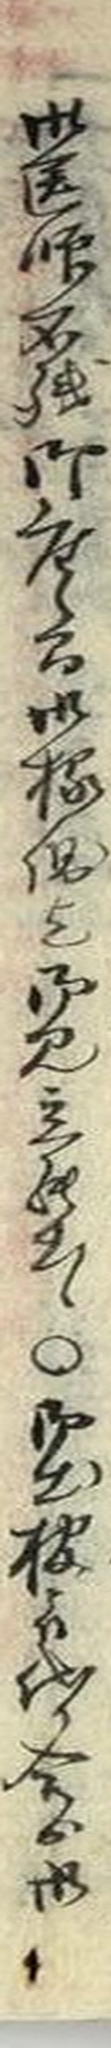御医師不残御座之間御縁側迄御見立罷出候〇御出棺ニ付代り合ゟ御
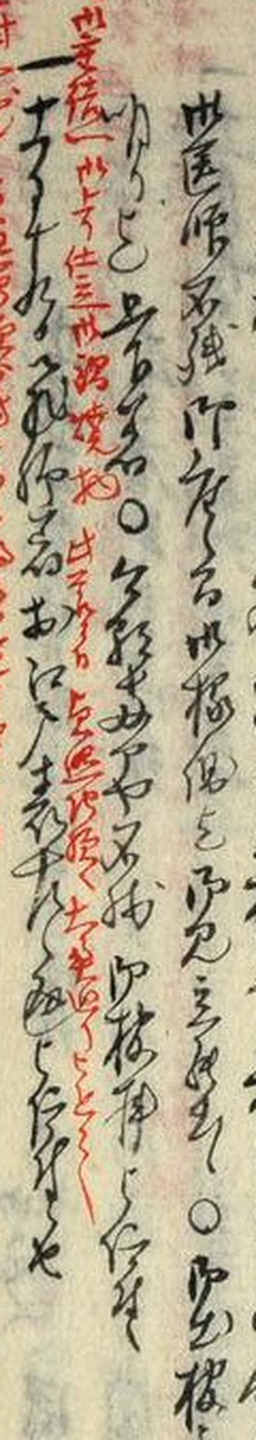明り迄上下着〇今朝両部や不残御棺拝被仰付候
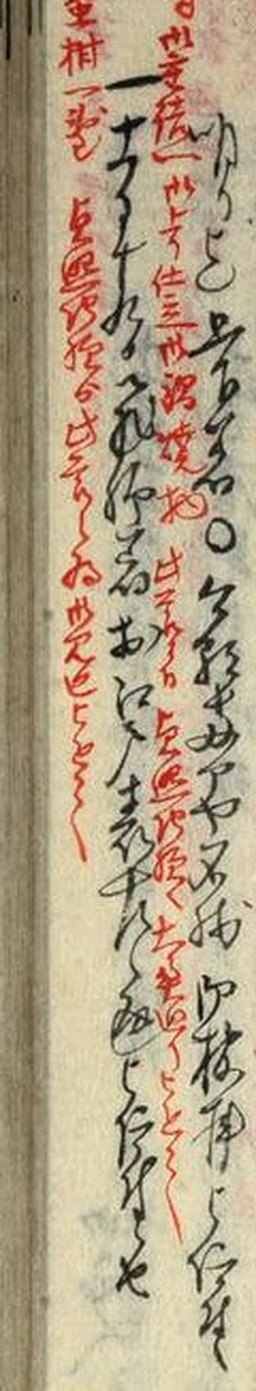一十一月十九日飛脚着於江戸表左之通被仰付候由

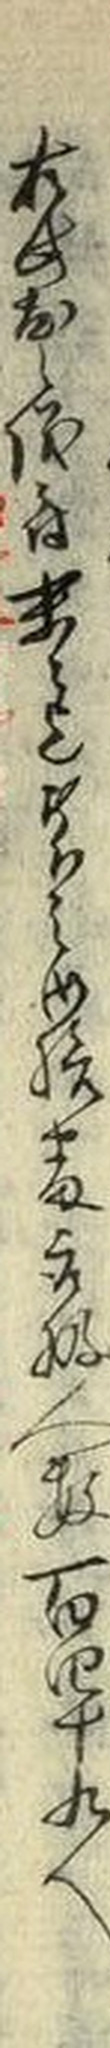右此度之儀ニ付末々迄被下之御膳番取扱人数百四十九人
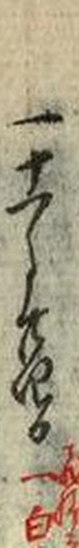一十一月廿四日
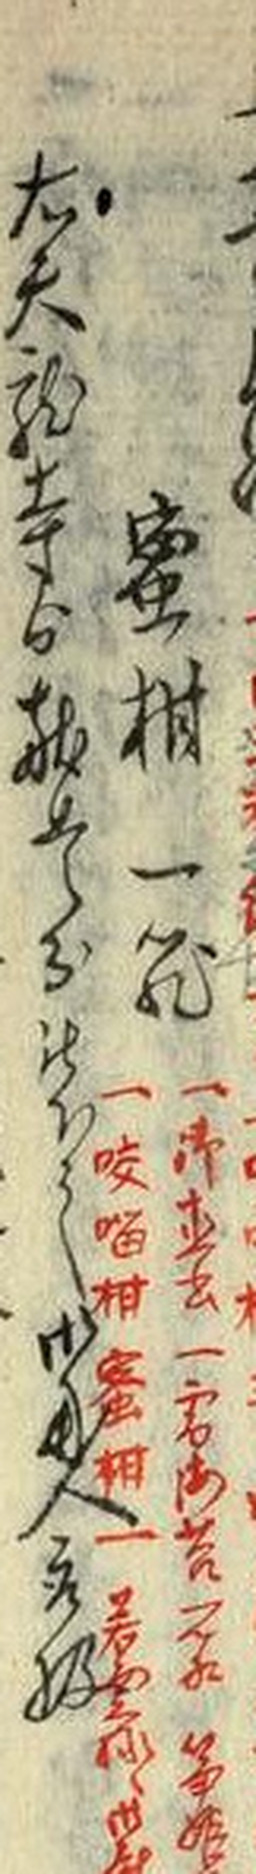右天龍寺ゟ献上之分被下之御用人取扱
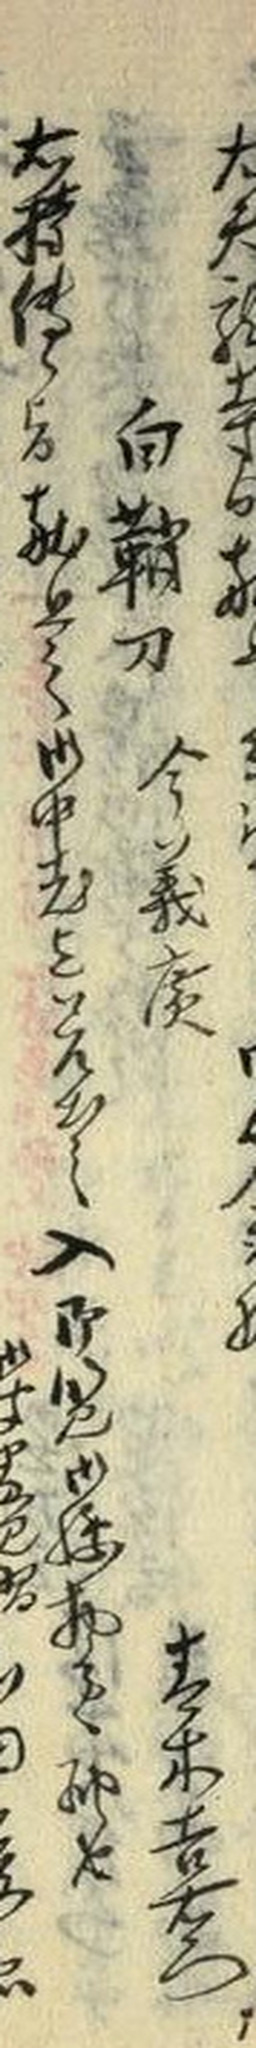右持伝候旨献上之御中老迄差出之入御覧御腰物方へ納候由
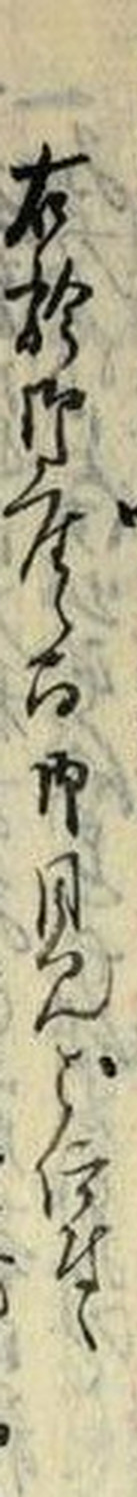右於御座之間御目見被仰付候
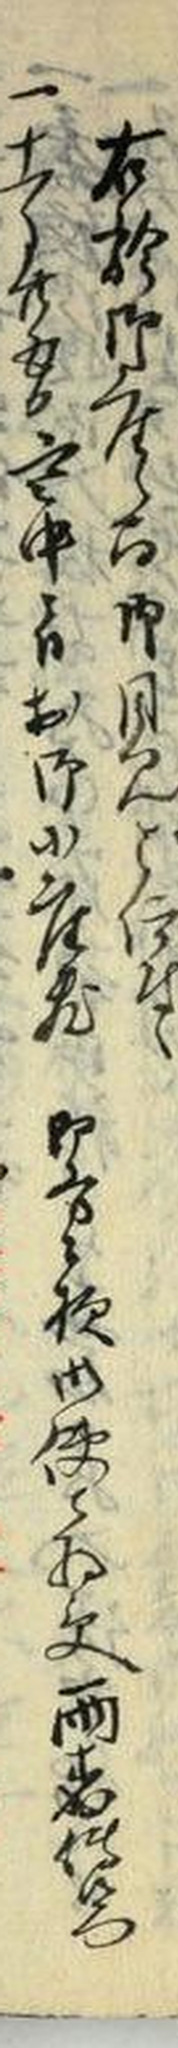一十一月廿五日寒中ニ付於御小座敷御方々様御使被為受雨森伝左衛門
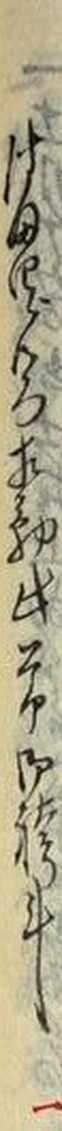津田四郎左衛門相勤此節御袴斗
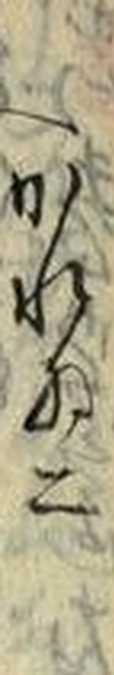かれゐ二
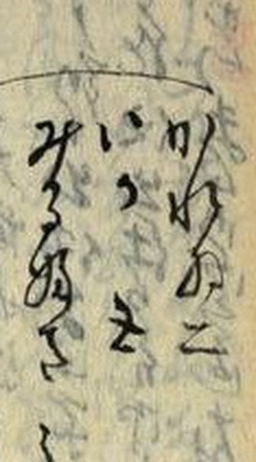いか五
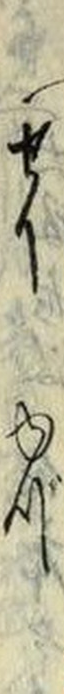せりゆづ
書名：少傅日録抄（斉承付側向頭取日記、在国）
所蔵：福井県文書館 Fukui Prefectural Archives
